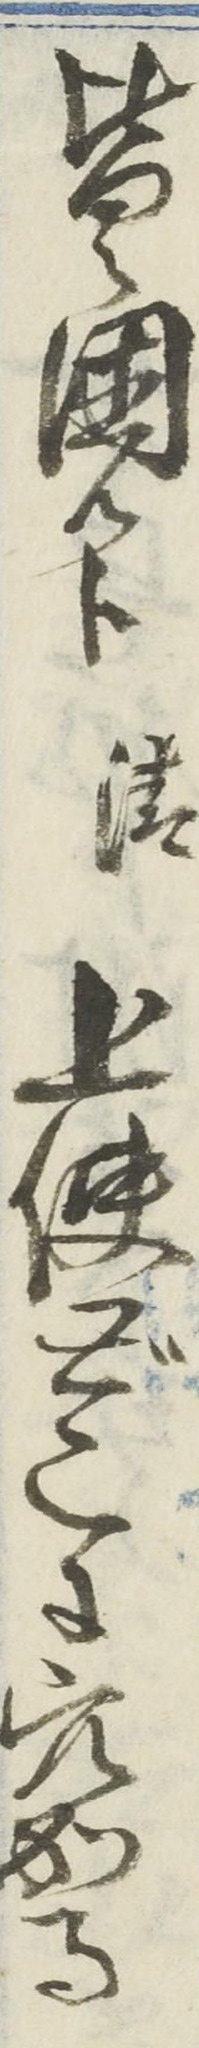皆々困ルト清上使どこに穴別？る
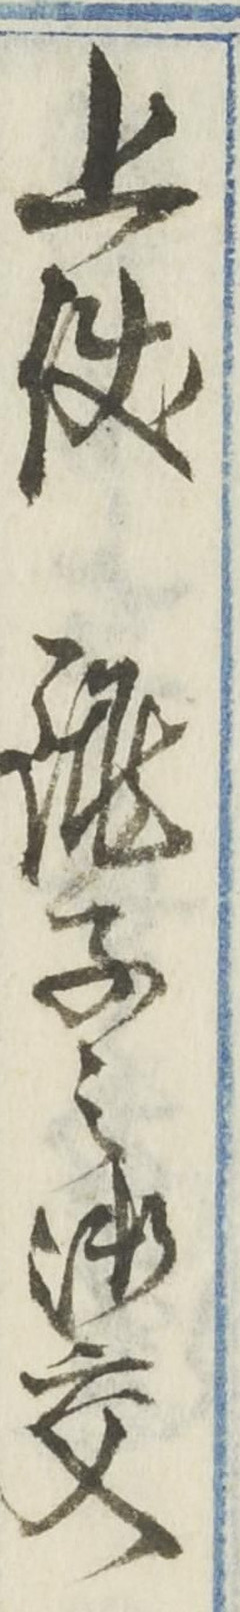上使銚子之御交
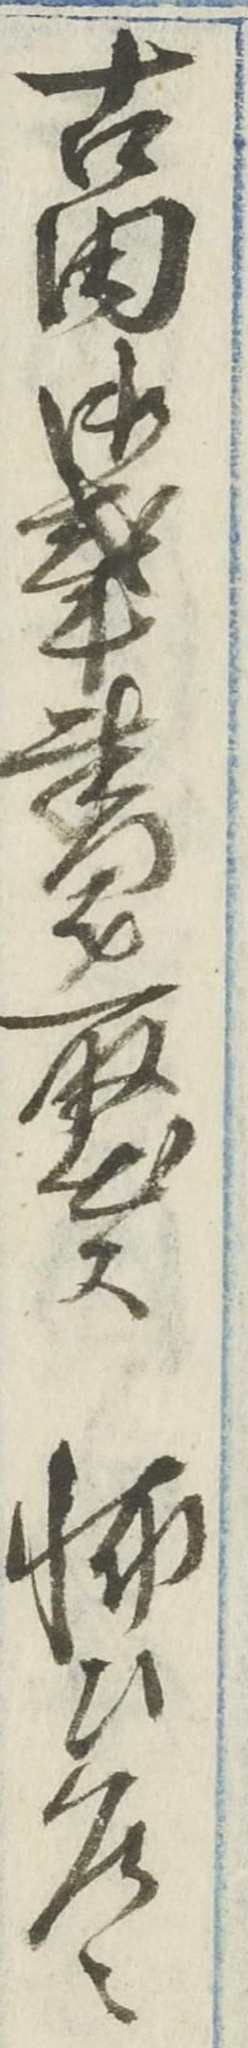古田御奉請ヲ取出ス怖ひ乍之
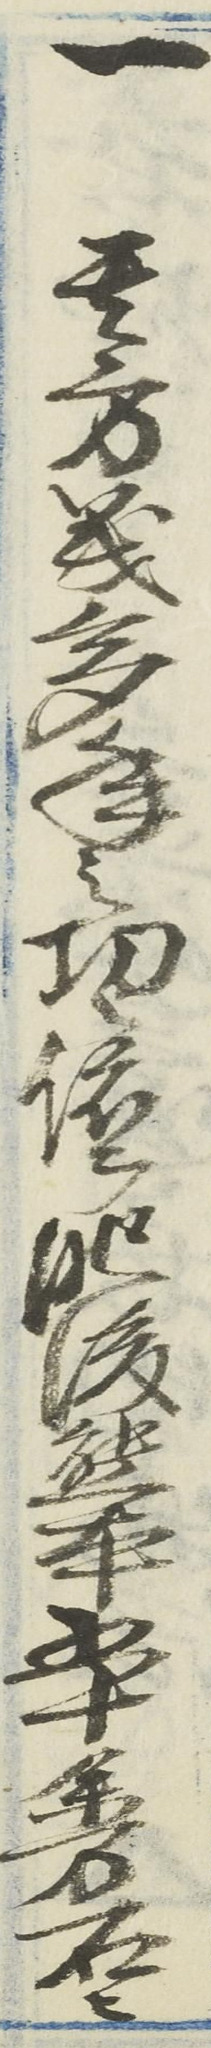一其方幾多年之功ニ依テ肥後熊本五十余万石ニ
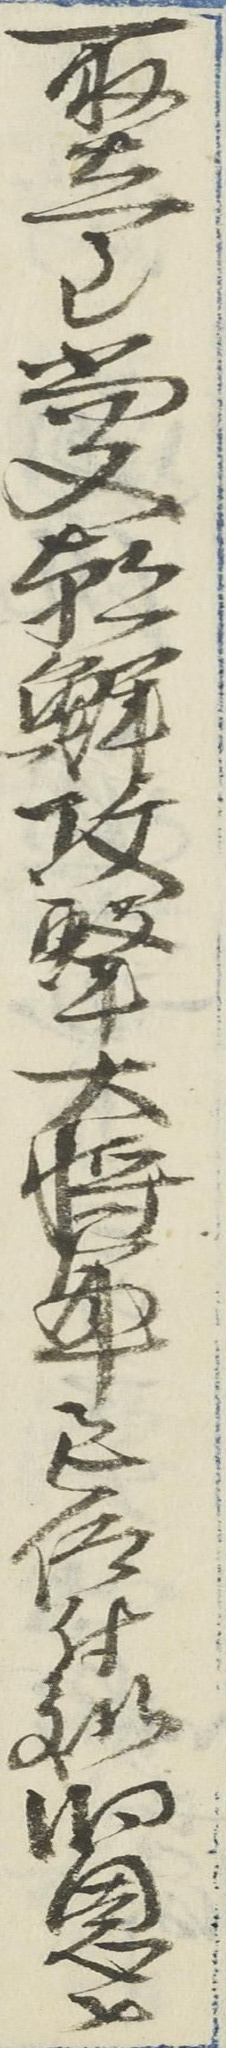取立ラレ尚又朝鮮攻撃大将軍ニヒ仰付処御恩ヲ
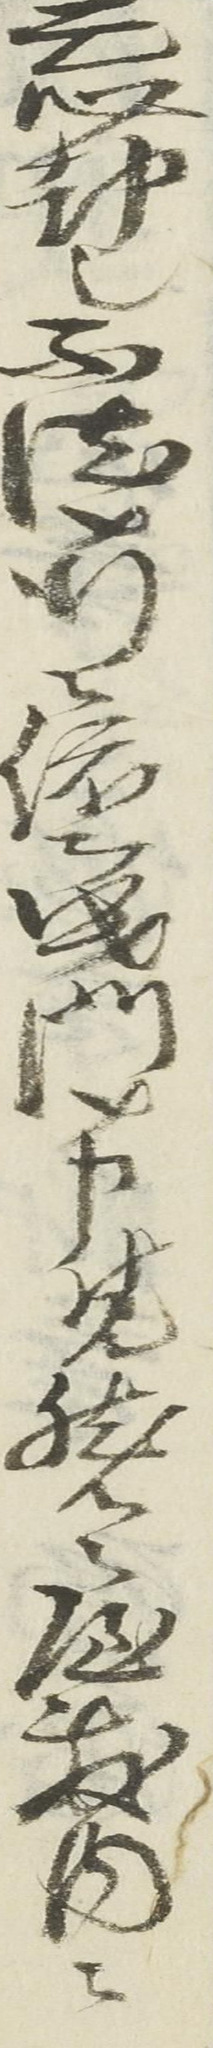忘却し不法ヲ行ニ依テ閉門ヲ申付ル然ㇽ二屋敷内ニ
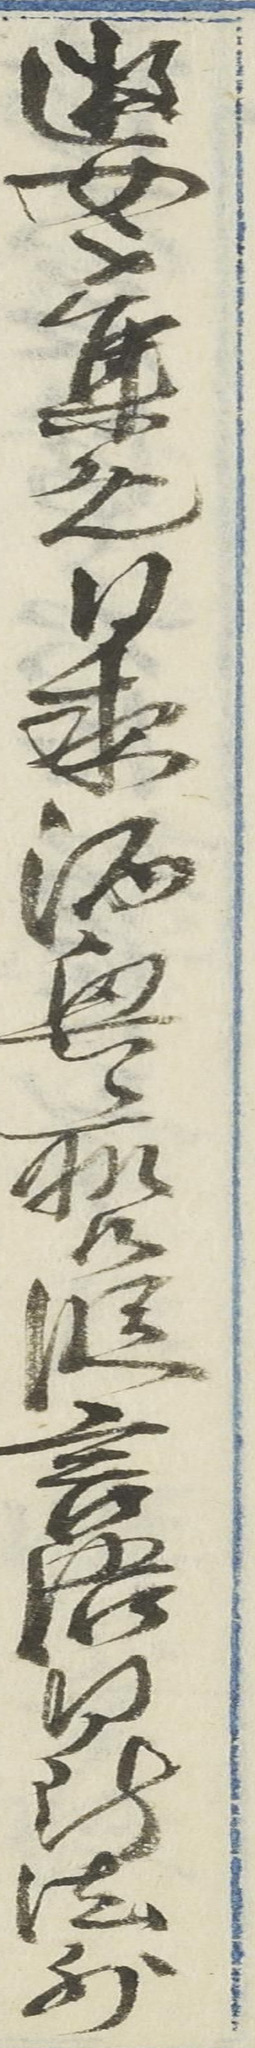遊女ヲ集め日夜酒興候所乃段言語道断断法外
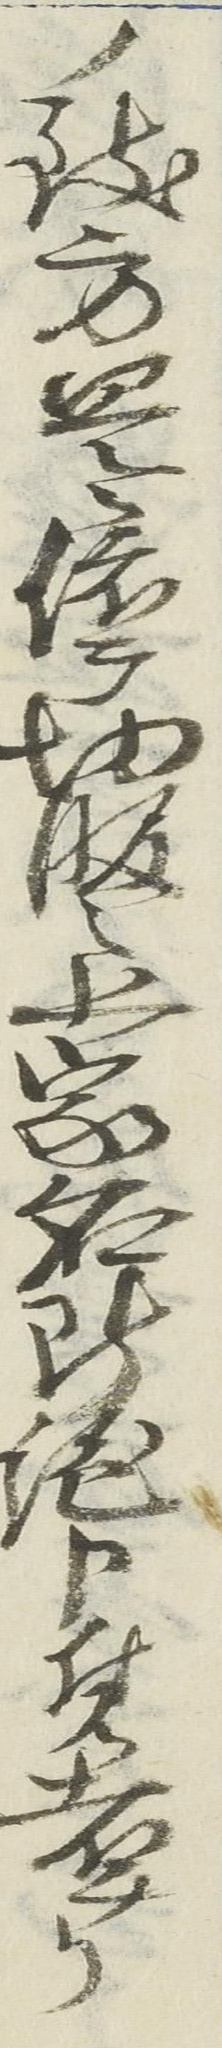ノ致方是ニ依テ切腹之上家名断絶申付ル者ナリ
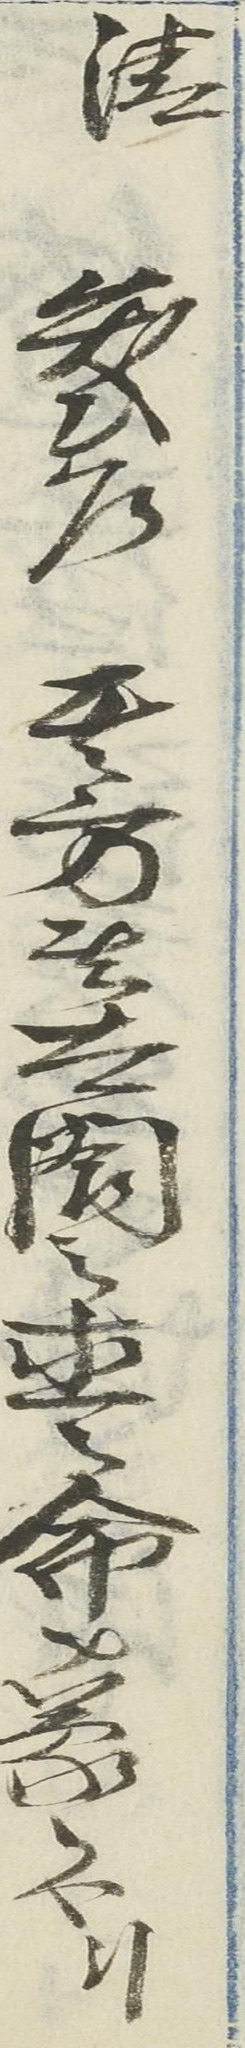清笑ひ乍其方共太閤之直々命ヲ蒙りや
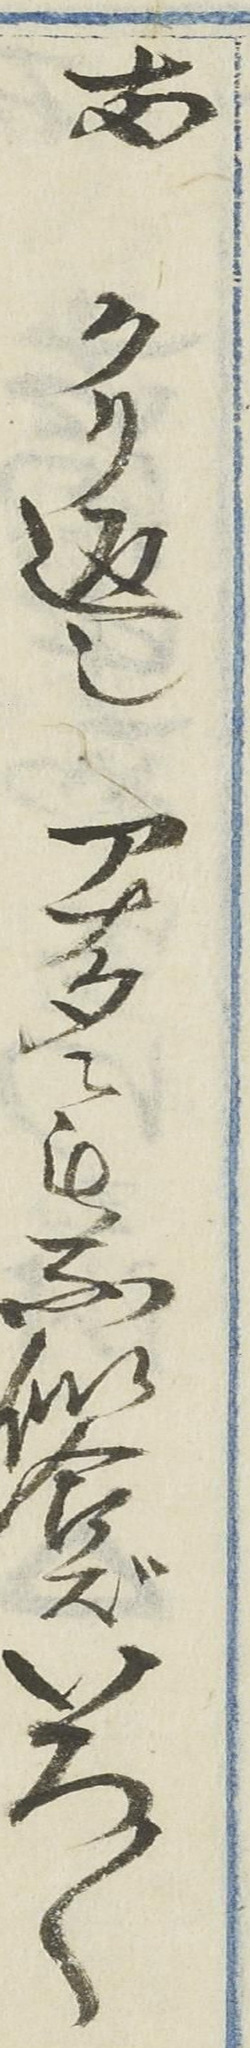両クリ返しアナタニモ不似合ズいろ〳〵
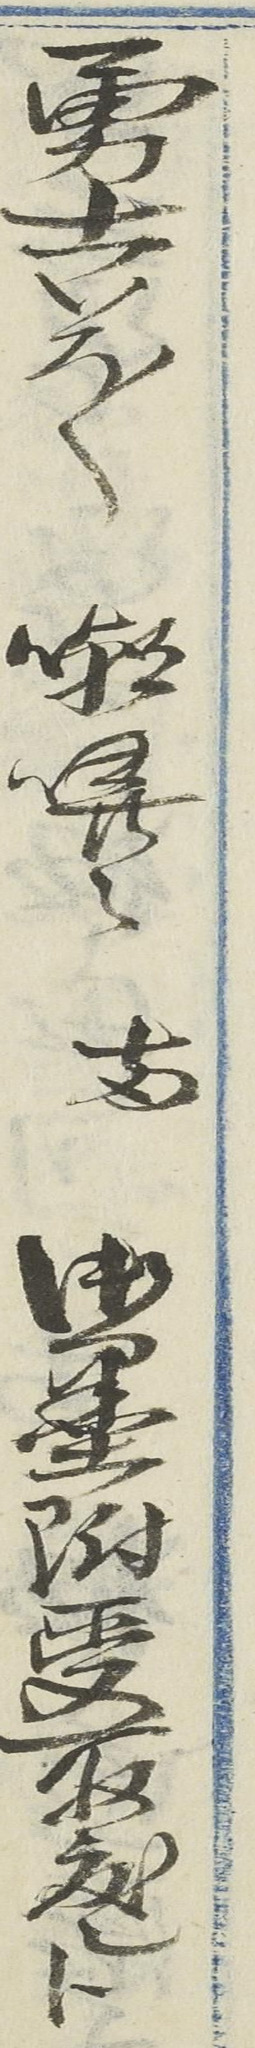勇士いろ〳〵嘲之両御墨附受取度シト
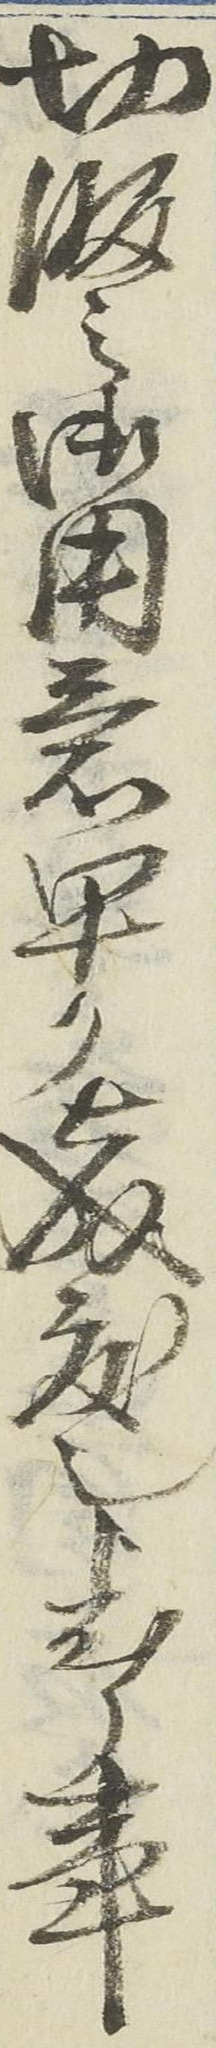切腹之御用意早クヒ成度シト云う事

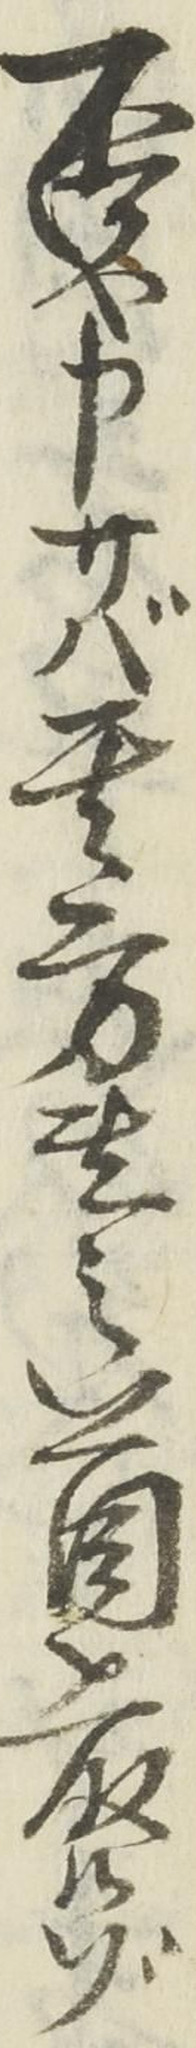清否や申サバ其方共之首ヲ取ルゾ
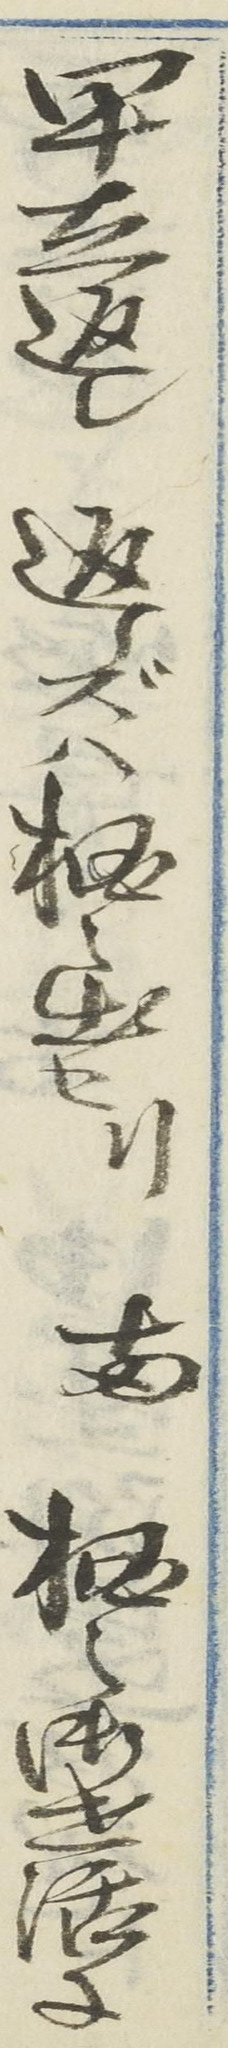早立返し返らズハ極ニ出セリ両極し御世話に
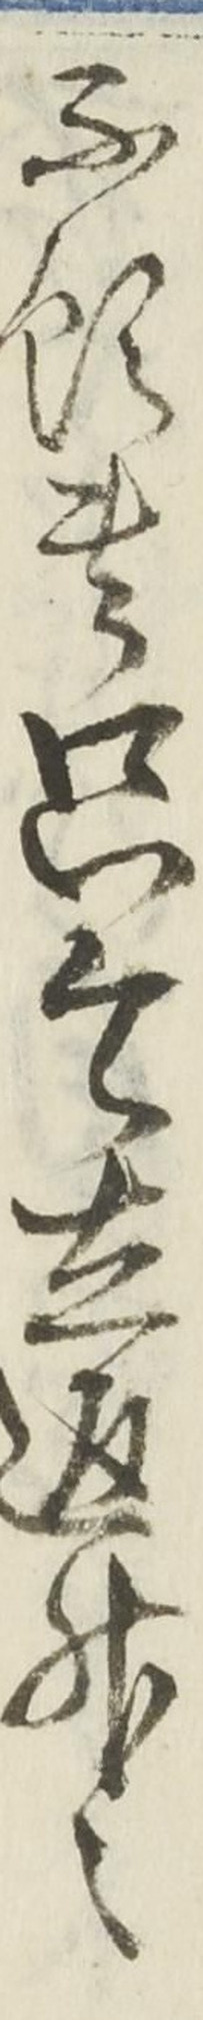不飲共只今立返升之
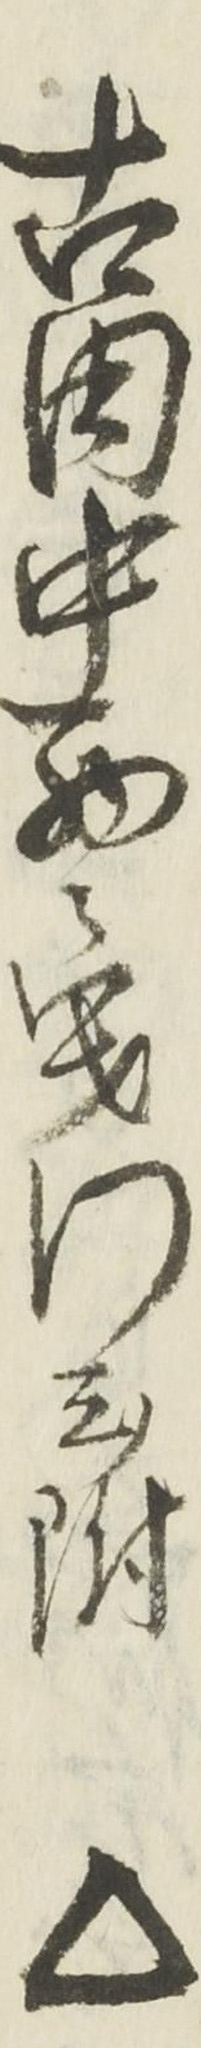石古田中西ニ閉門云附
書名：伏水大地震
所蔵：東京大学地震研究所図書室 Earthquake Research Institute Library, The University of Tokyo, JAPAN
